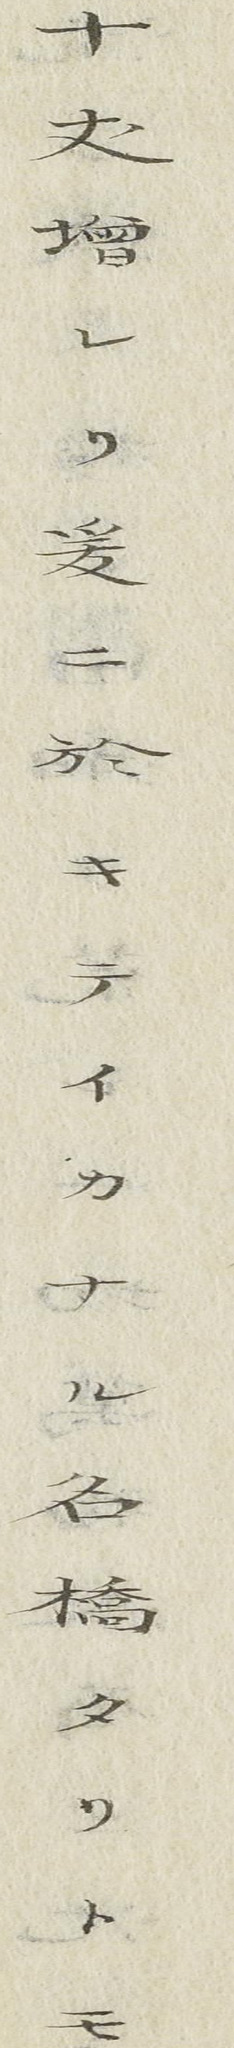十丈増レリ爰ニ於キテイカナル名橋タリトモ
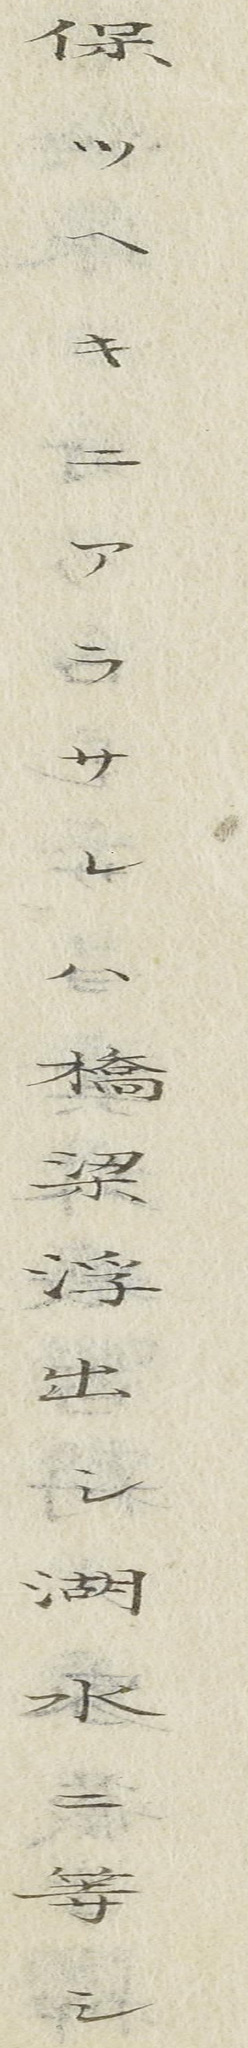保ツヘキニアラサレハ橋梁浮出シ湖水ニ等シ
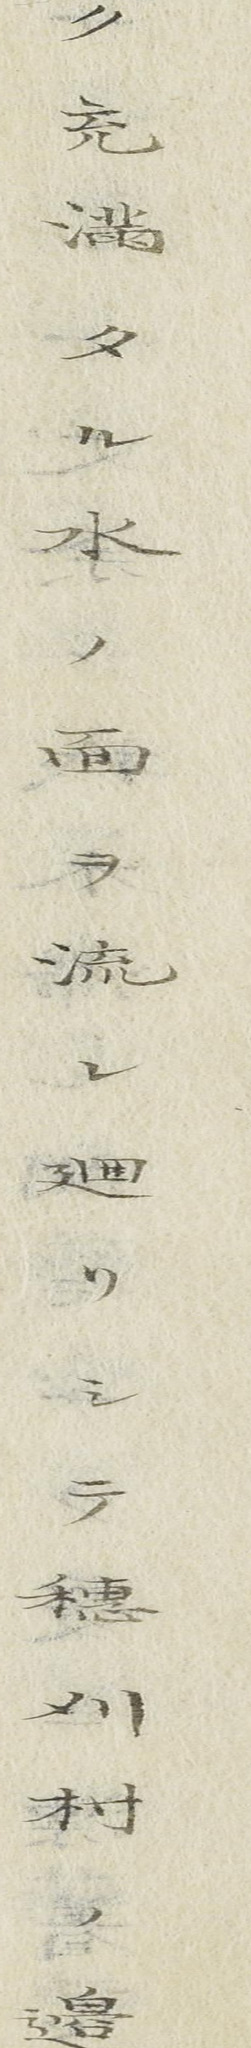ク充満タル水ノ面ヲ流レ廻リシテ穂刈村ノ辺
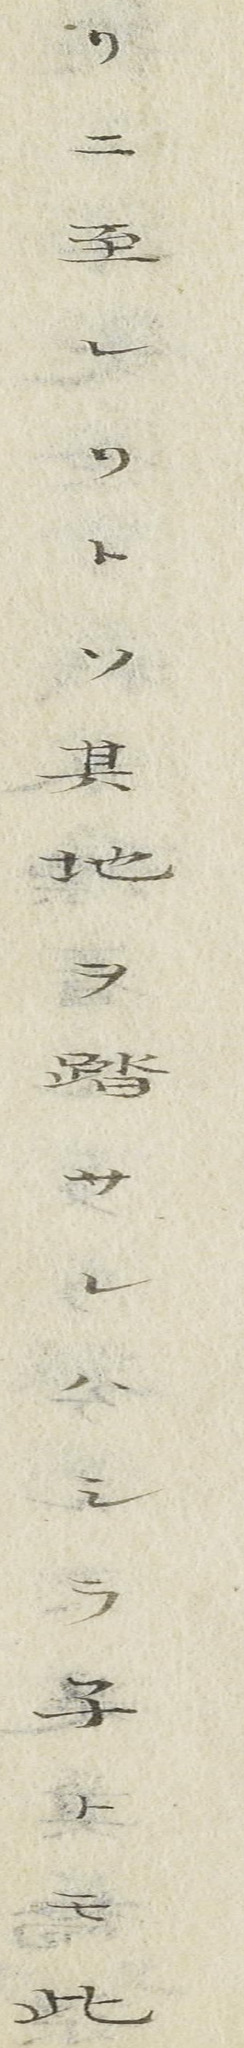リニ至レリトソ其地ヲ踏サレハシラ子トモ此
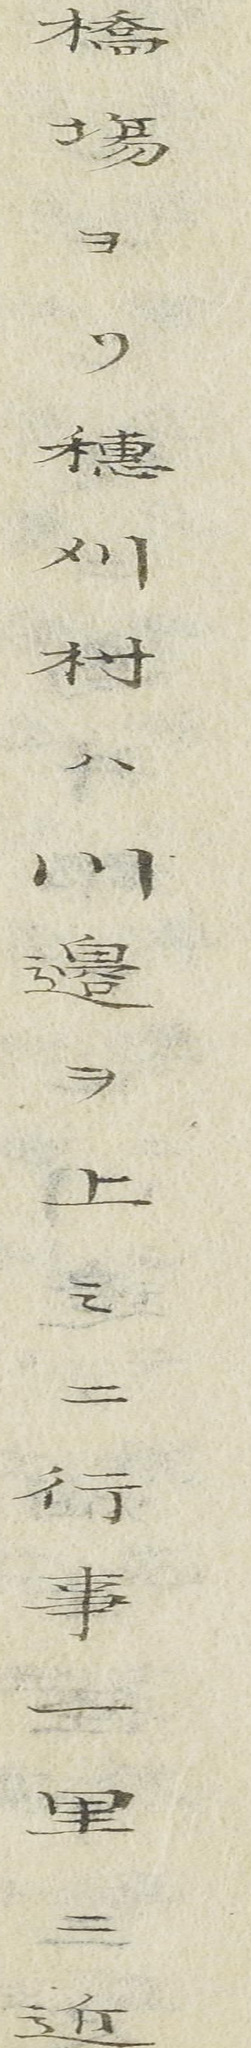橋場ヨリ穂刈村ハ川辺ヲ上ミニ行事一里ニ近
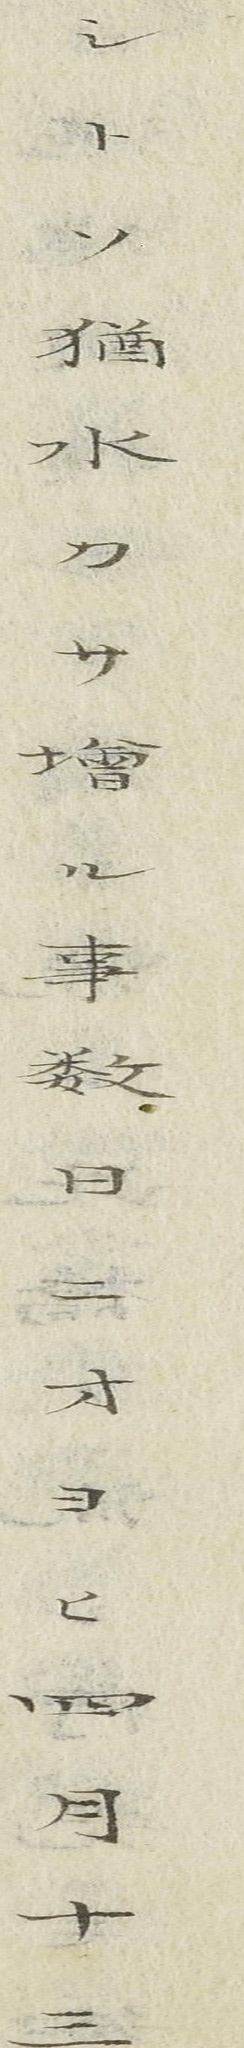シトソ猶水カサ増ル事数日ニオヨヒ四月十三

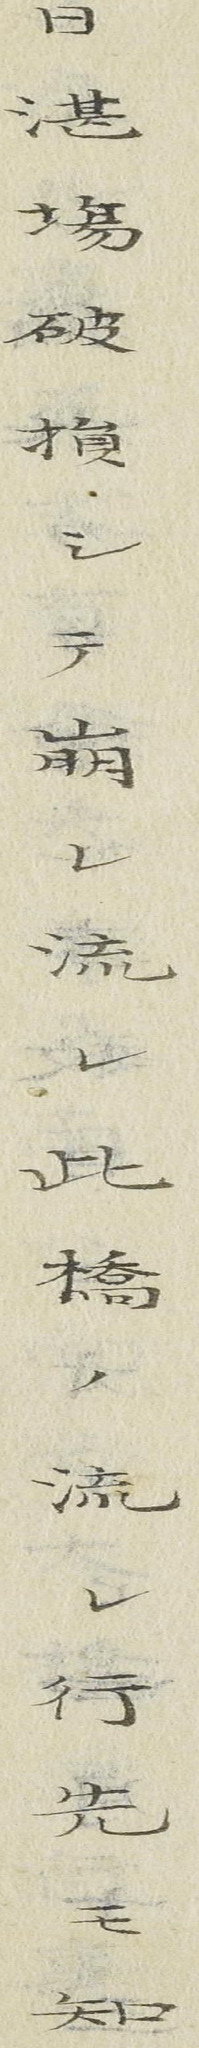日湛場破損シテ崩レ流レ此橋ノ流レ行先モ知
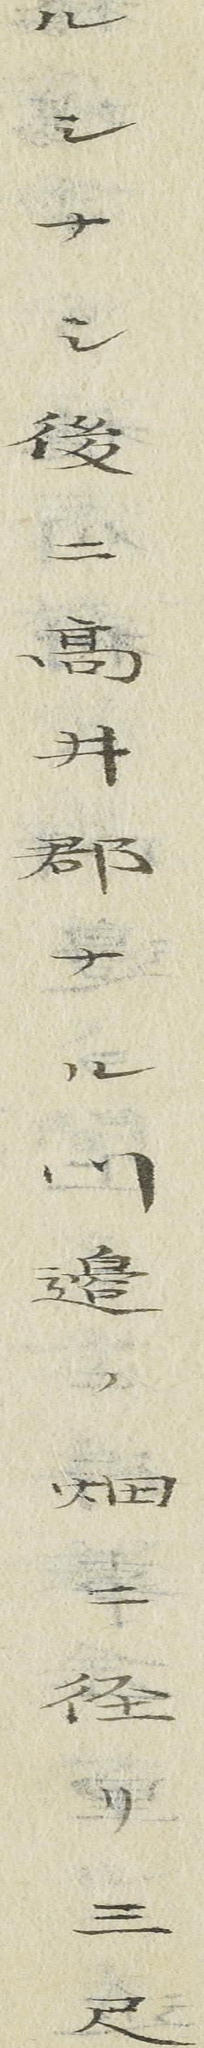ルシナシ後ニ高井郡ナル川辺ノ畑ニ径リ三尺
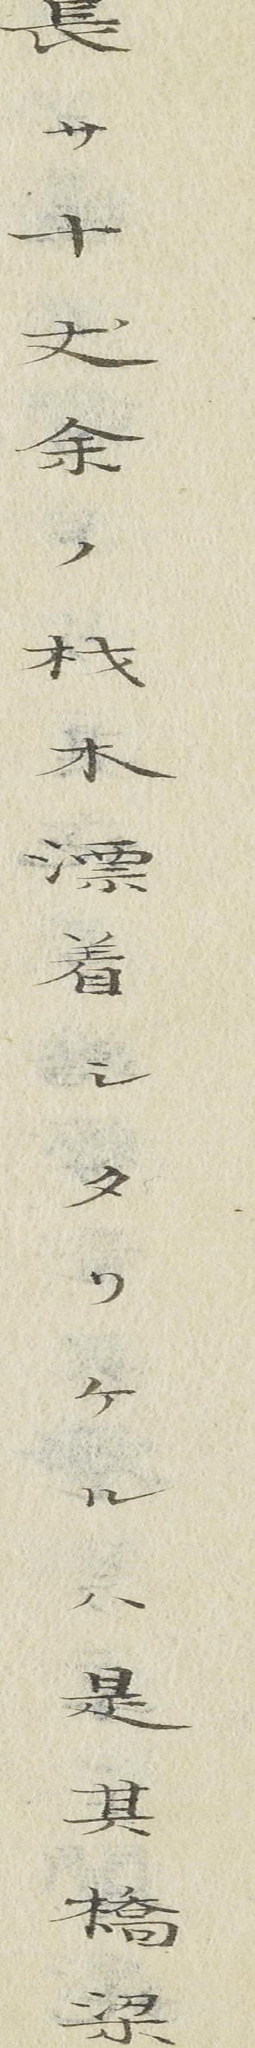長サ十丈余ノ材木漂着シタリケルハ是其橋梁
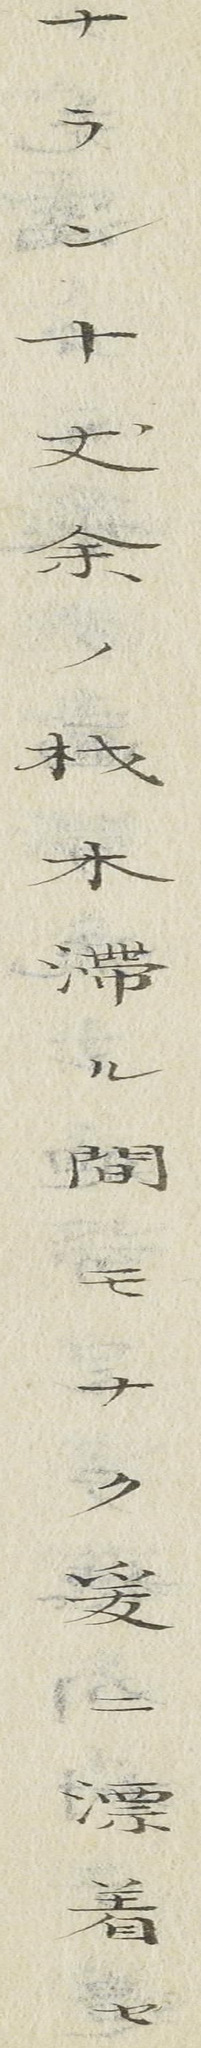ナラン十丈余ノ材木滞ル間モナク爰ニ漂着セ
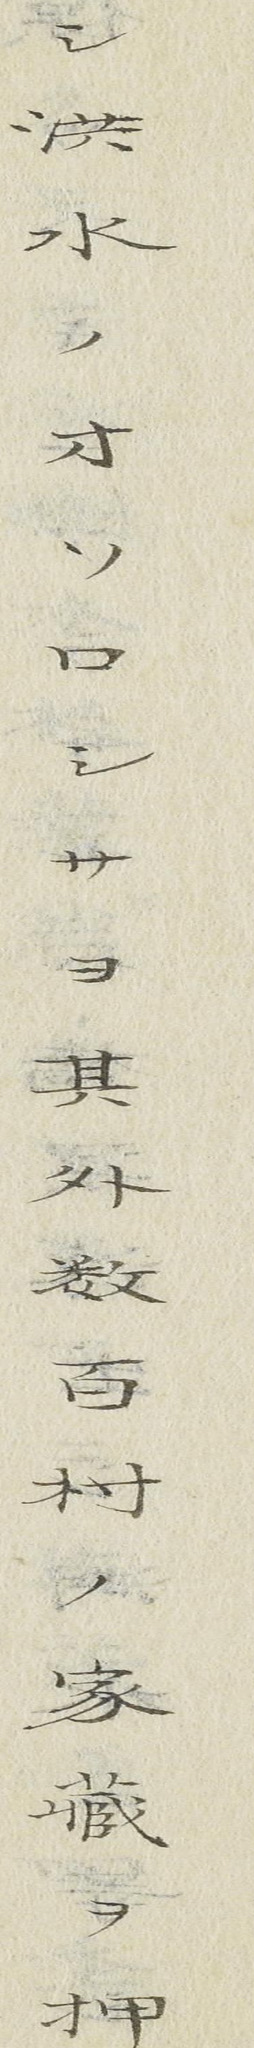シ洪水ノオソロシサヨ其外数百村ノ家蔵ヲ押
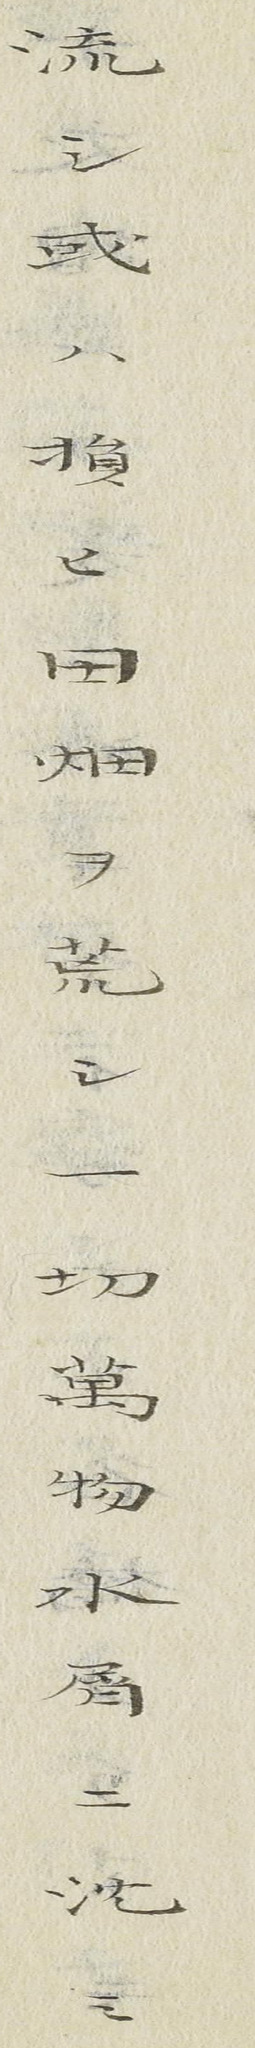流シ或ハ損ヒ田畑ヲ荒シ一切万物水屑ニ沈ミ
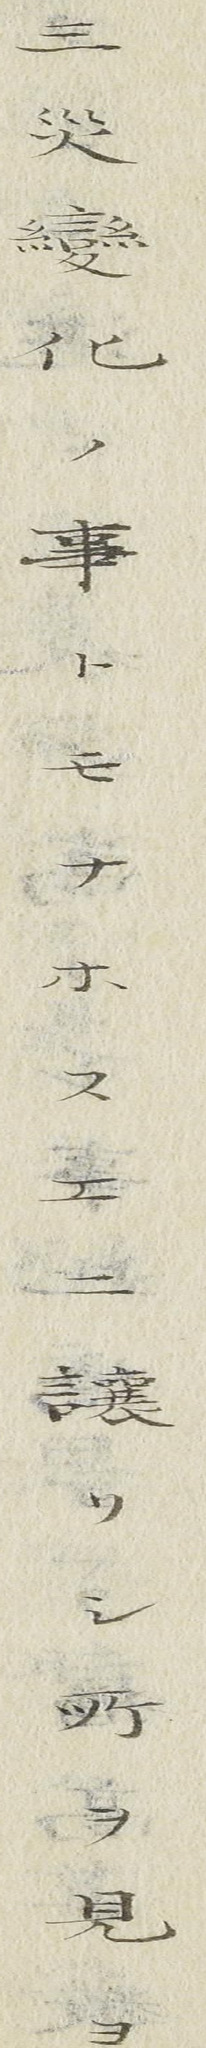三災変化ノ事トモナホスエニ譲リシ所ヲ見ヨ
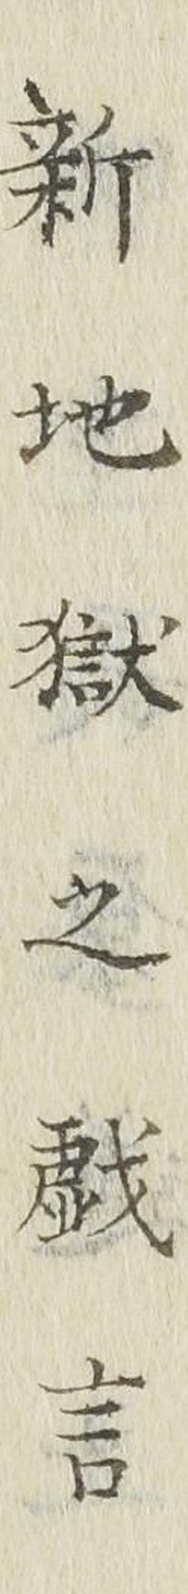新地獄之戯言
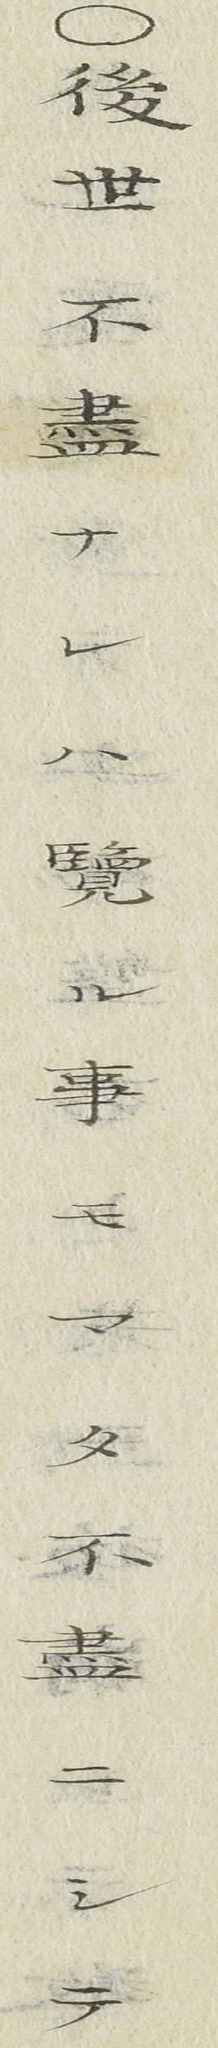〇後世不尽ナレハ覧ル事モマタ不尽ニシテ
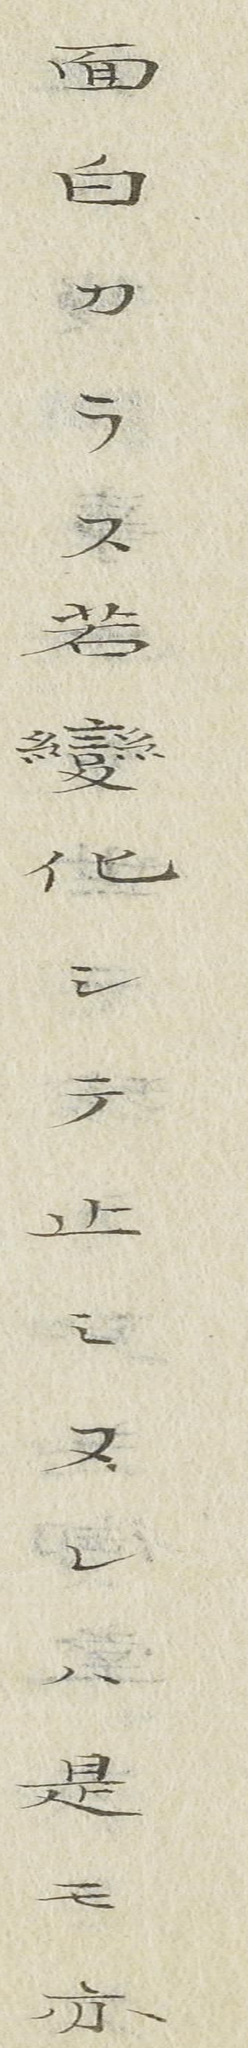面白カラス若変化シテ止ミヌレハ是モ亦
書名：地災撮要　地震之部　巻ノ二
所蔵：東京大学地震研究所図書室 Earthquake Research Institute Library, The University of Tokyo, JAPAN
